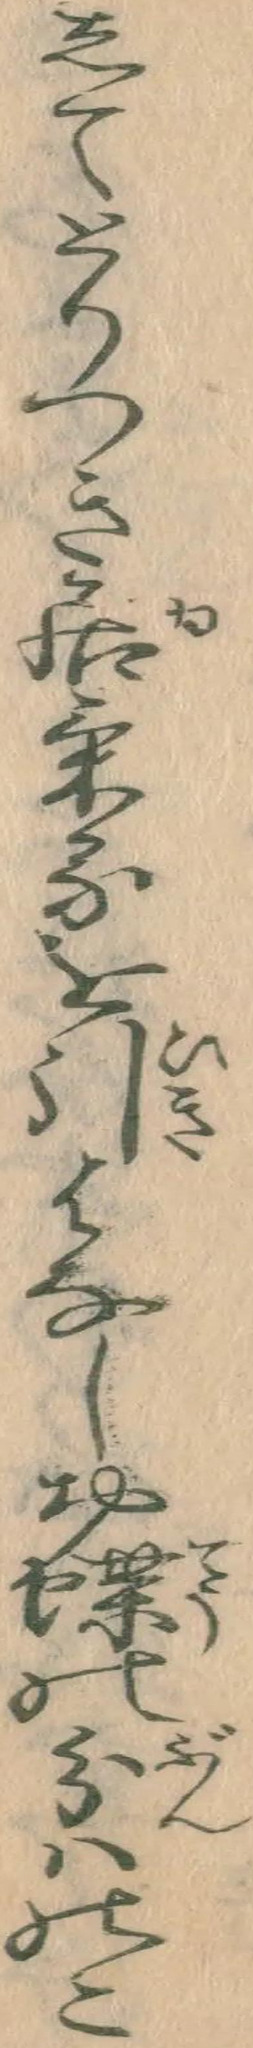してとりつき居けるを引はなしお蝶の分はのこ
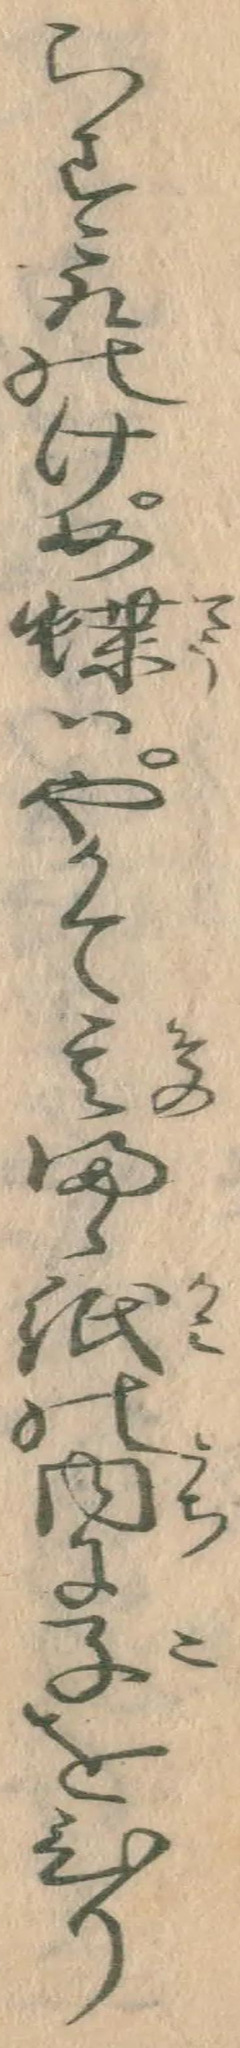らす取のけ。め蝶は。やかて其まゝ紙の内に子をひり
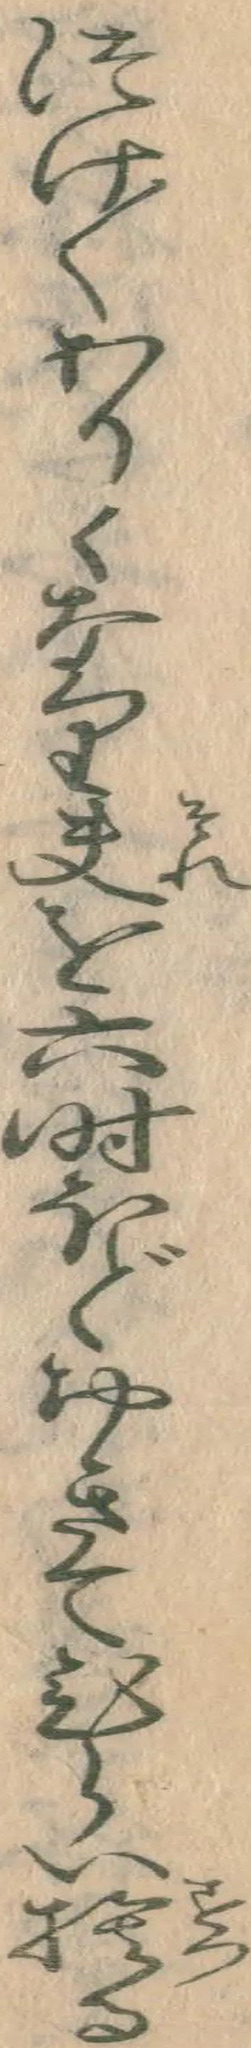つけ〳〵ありくなり夫を六時ほどおきてひらい捨る
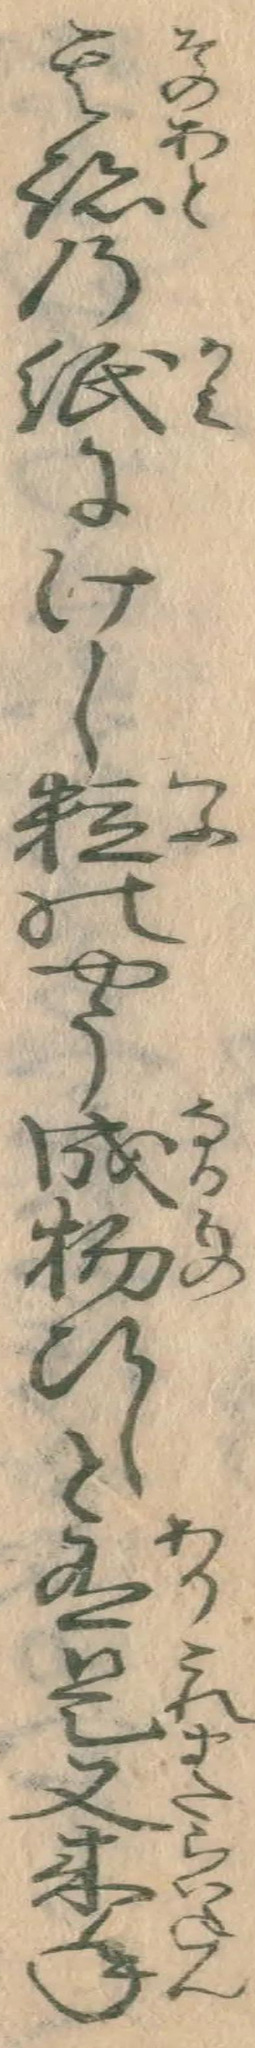其跡の紙にけし粒のやう成物ひしと有是又来年
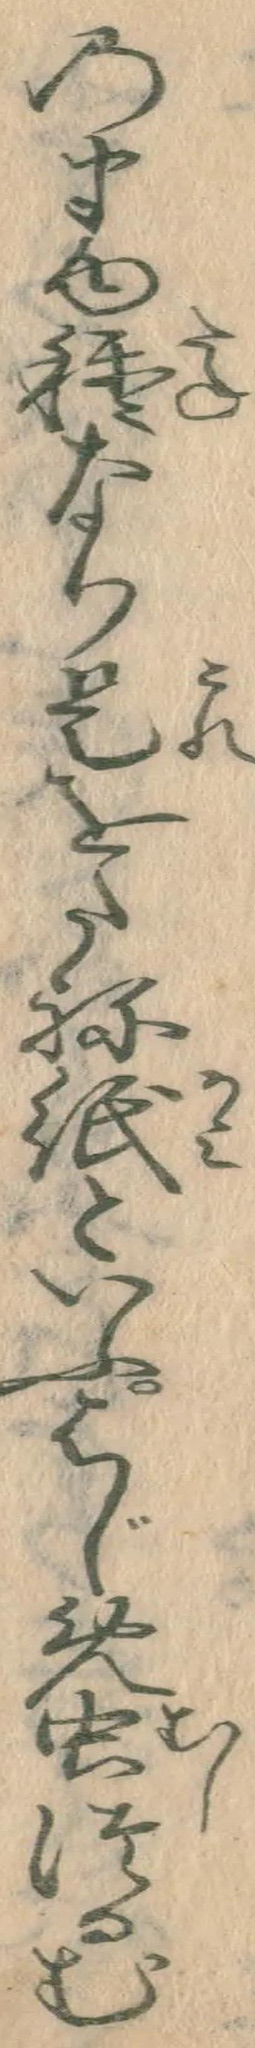のまゆ種なり是をたね紙といふ。はじめ虫つるむ
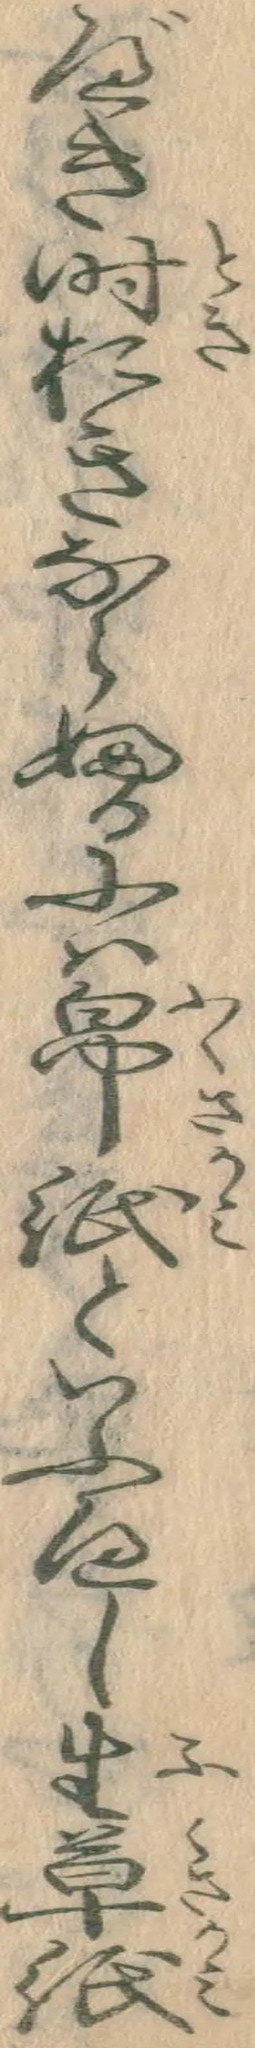べき時おきならふるには帛紙といふへし生草紙
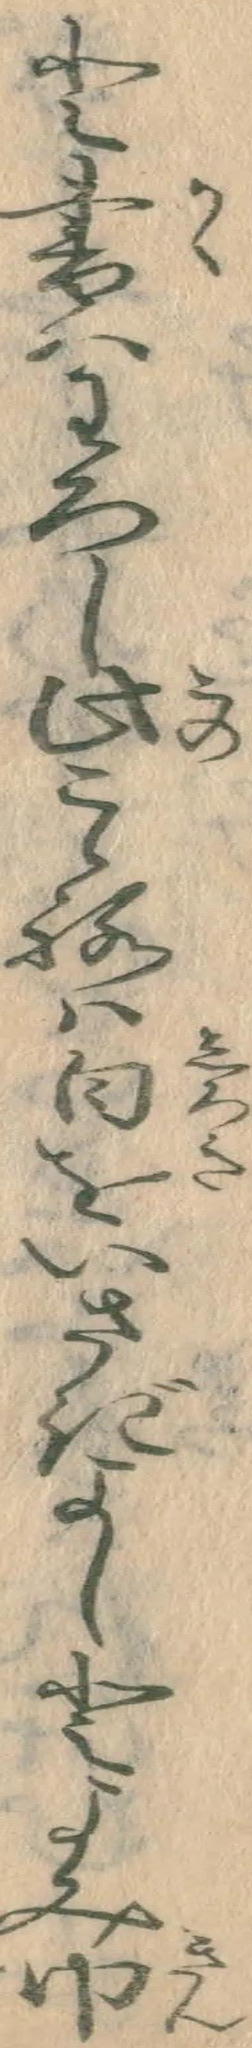と書はわろし此こゝろは白をいさぎよしとよみ巾
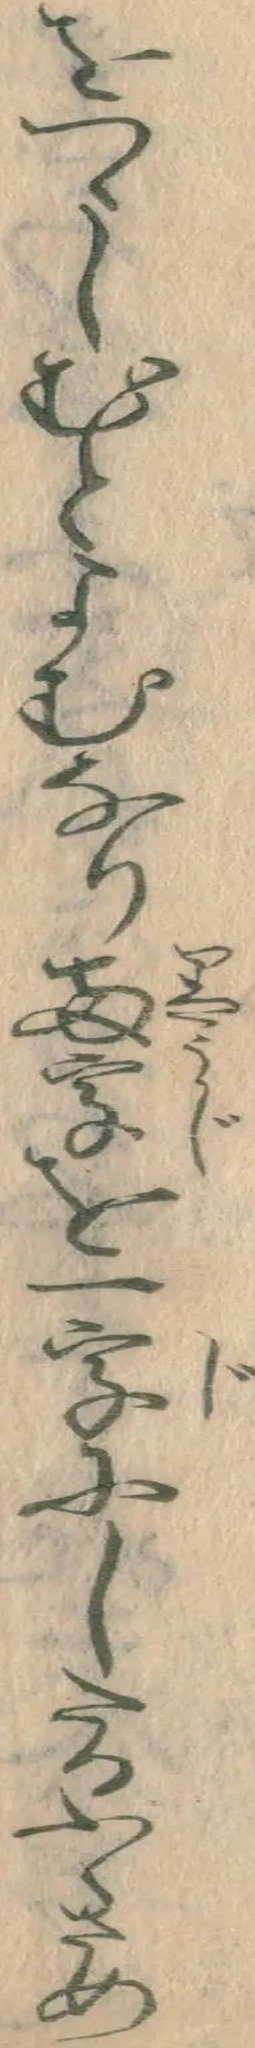をつゝしむとよむなり両字を一字にしたるふくさめ
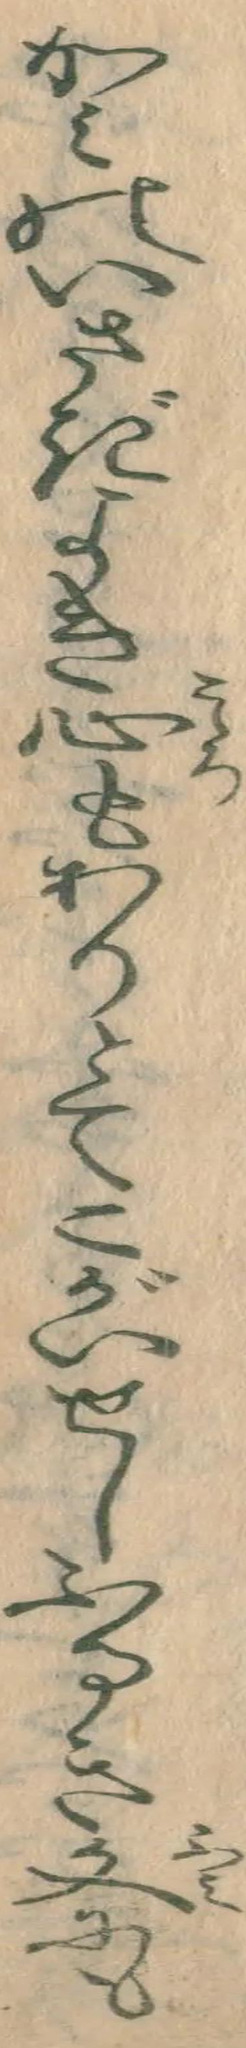かみのいさぎよき心もありとてこがいせしふるき文にも

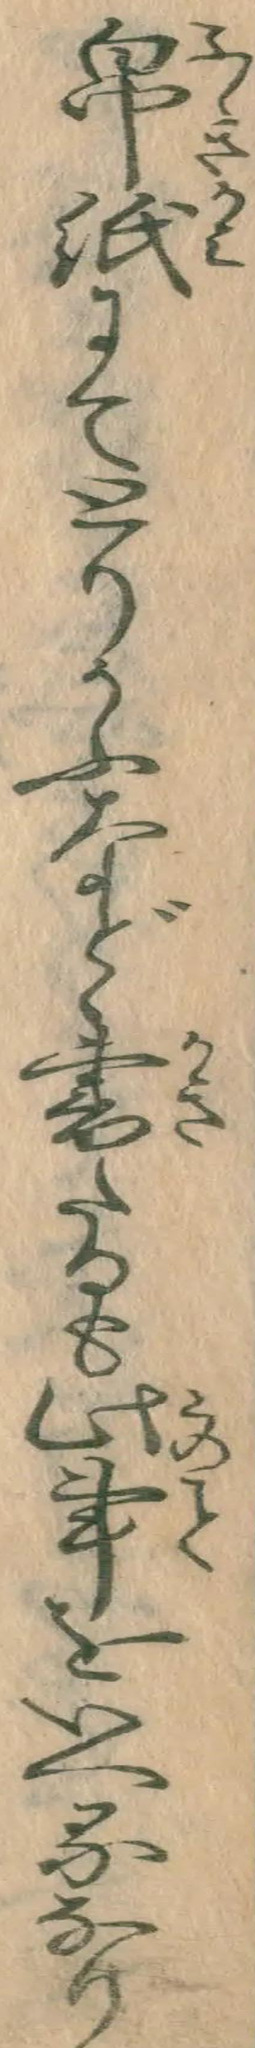帛紙にてとりかふなどゝ書たるも此事をいへるなり
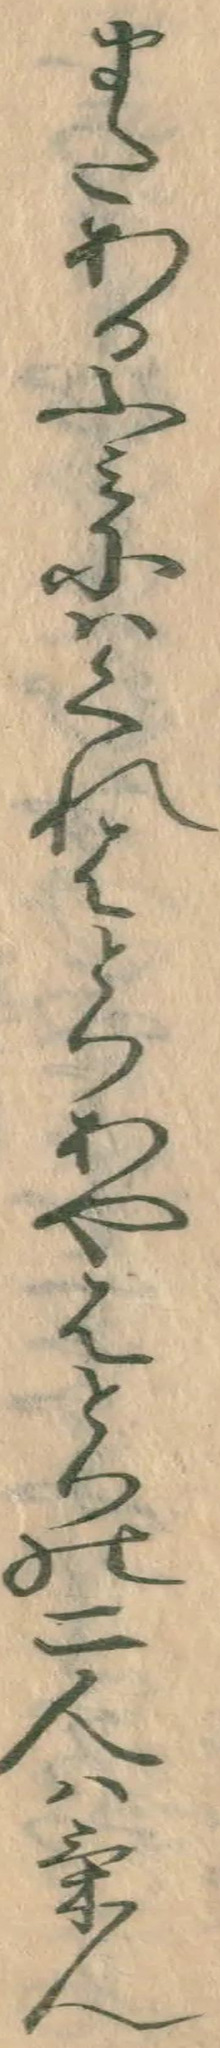またあるふみにはくれはとりあやはとりの二人はけん
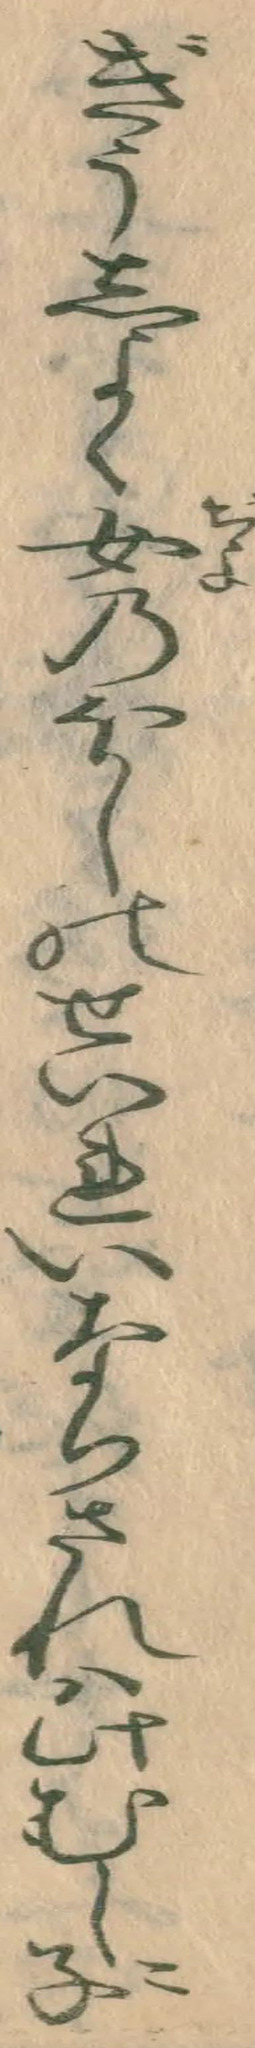ぎうしよく女のほしのせいれいなりされは此むし子
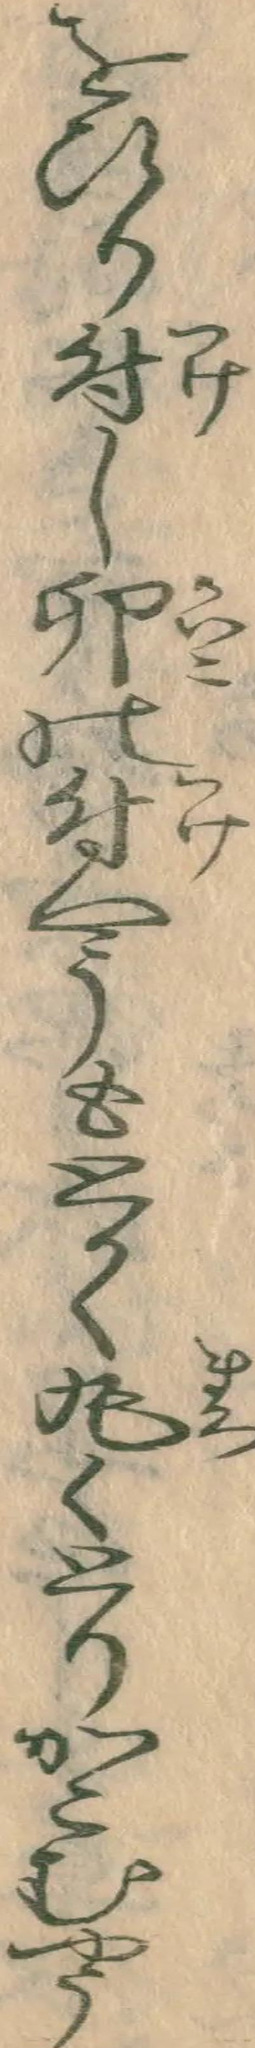をひり付し卵の付やうもとかく丸くとりかこむやう
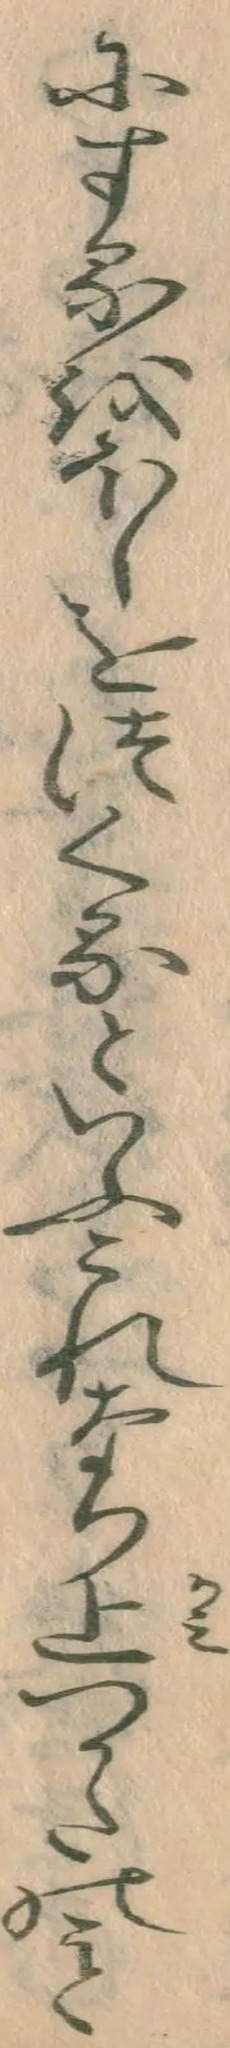にするをほしをつくるといふこれなり上つかたのこと
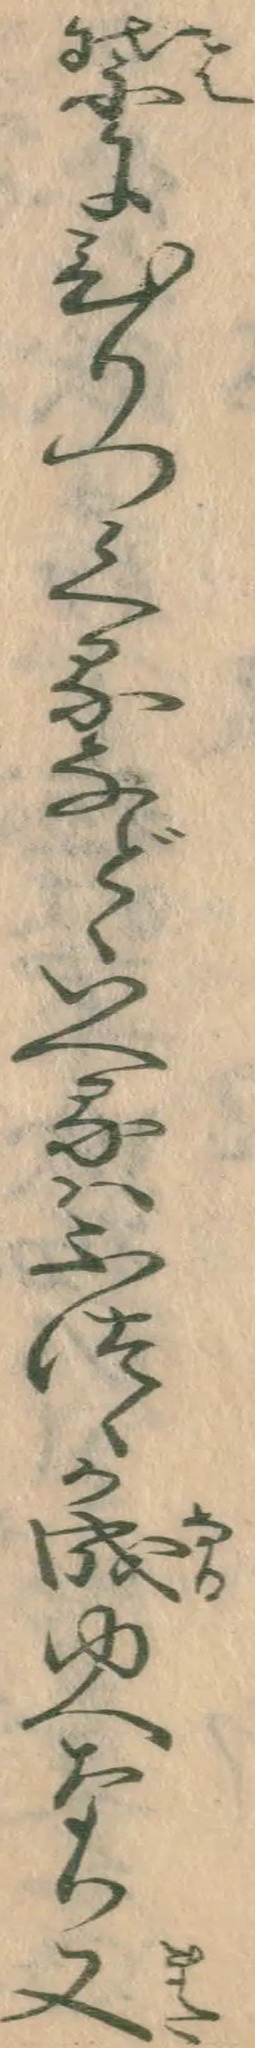葉にひりつくるなどゝいへるはふつゝか成ゆへなり又
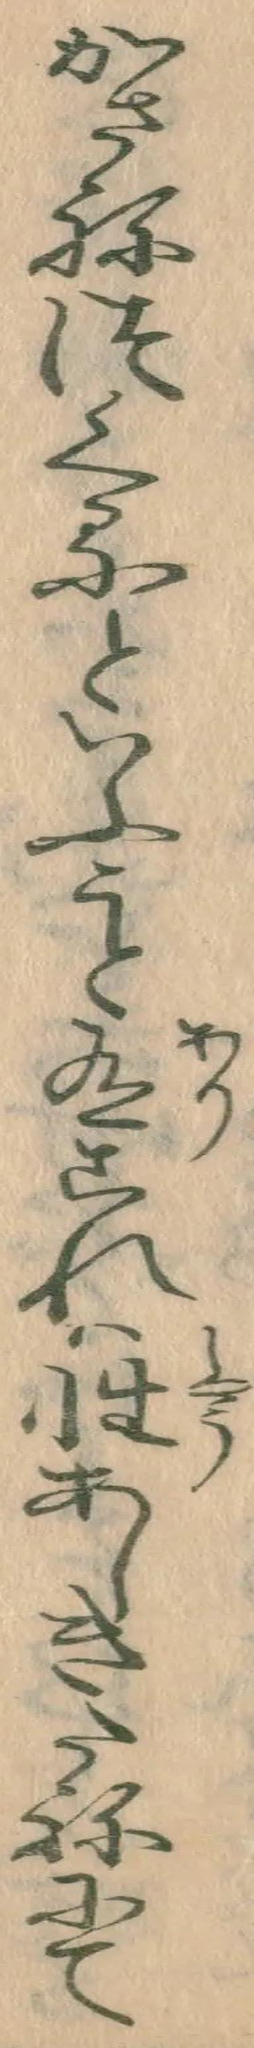かさねつくるといふこと有これは性あしきたねにて
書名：蚕飼養法記
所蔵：国立国会図書館 National Diet Library, JAPAN
